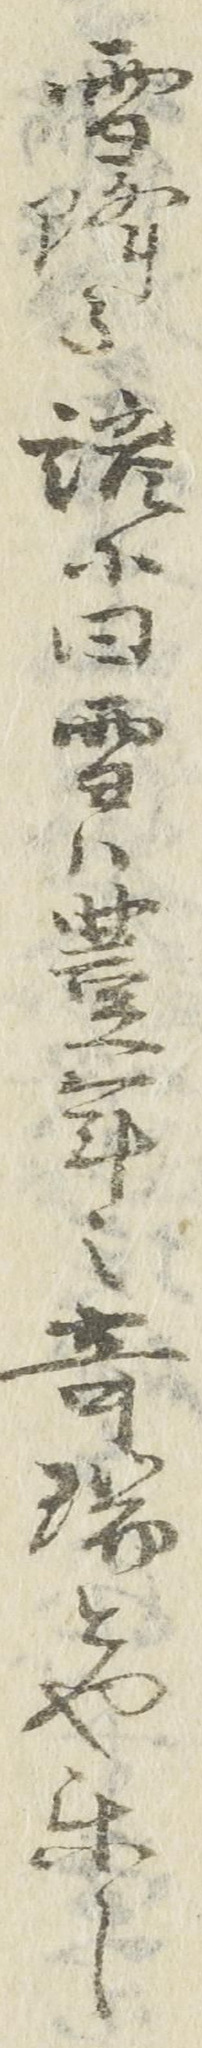雪降る諺に曰雪ハ豊年之奇瑞とや楽し
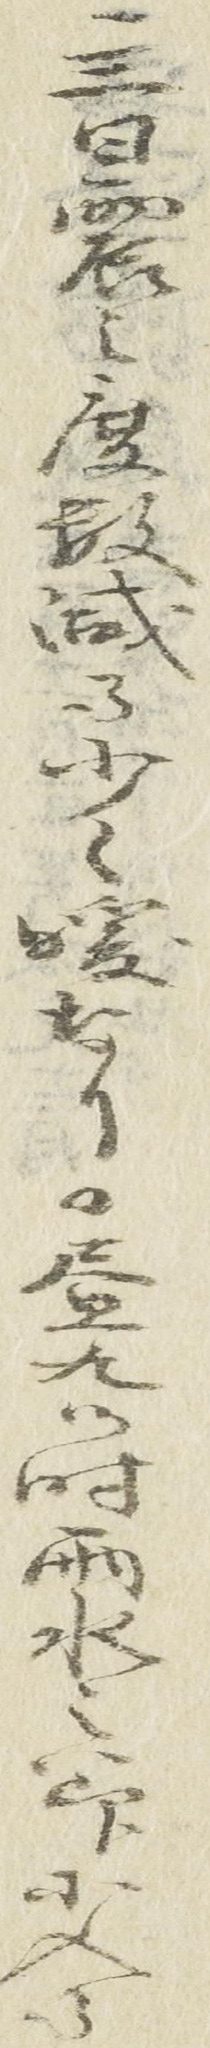・三日震之度数減る少々暖なり〇昼九ツ時雨水之節に入る
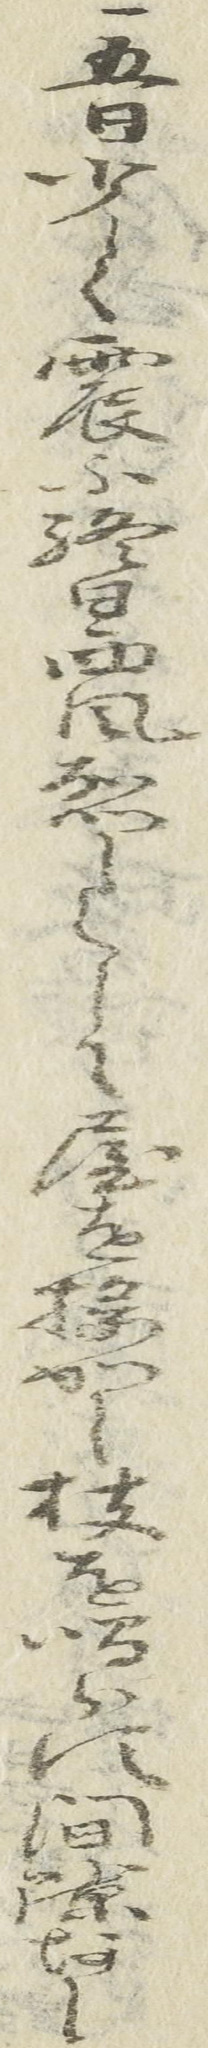・五日少しく震ふ終日西風烈しくして屋を揺かし枝を鳴らす間隙なし
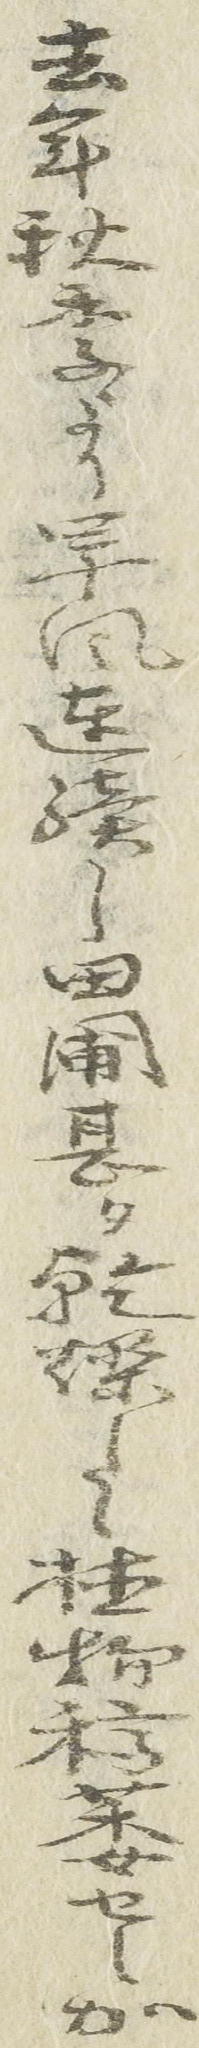去年秋季より早風連続し田圃甚タ乾燥して植物稿萎せしが
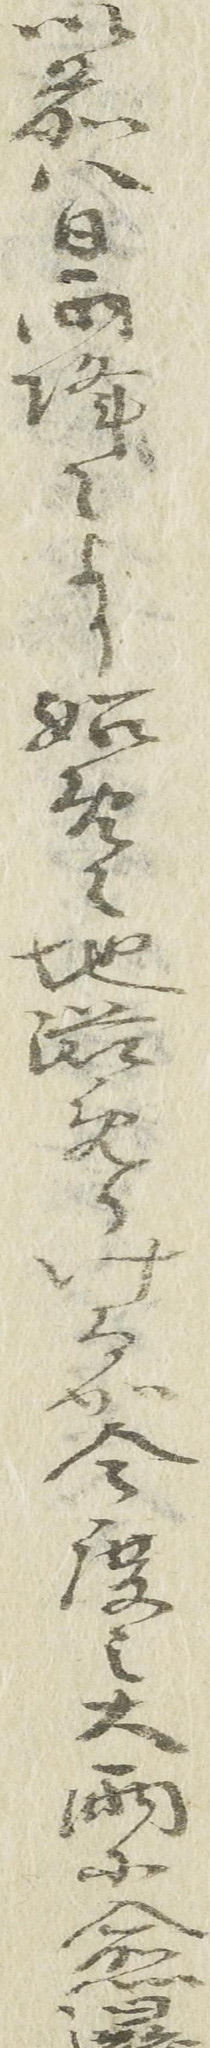以前八日雨降てより始めて地滋めりけるが今度之大雨に愈湿
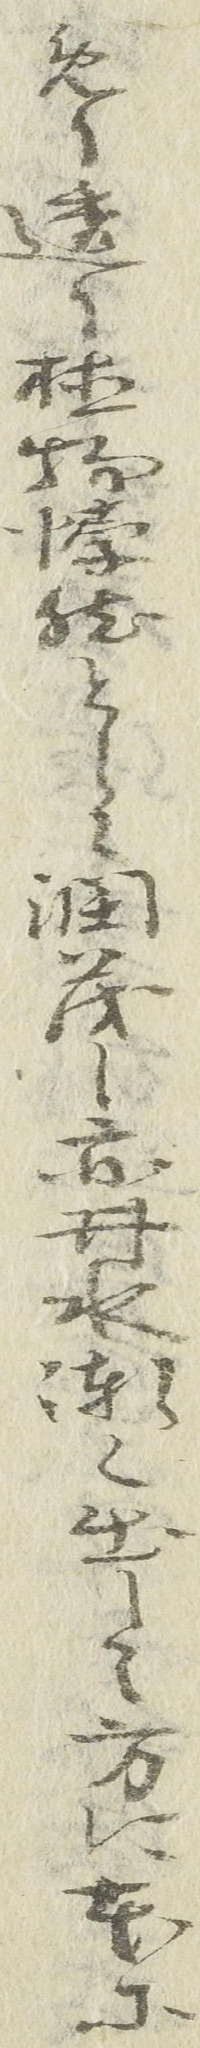めり透り植物悖然として潤もし亦井水漸く出して方に本に
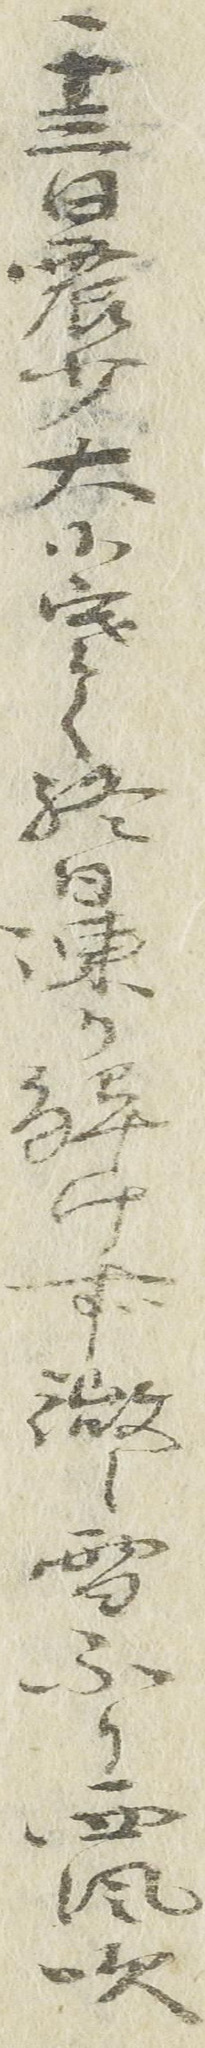・十三日震少大に寒く終日凍り解けず微之雪ふり西風吹
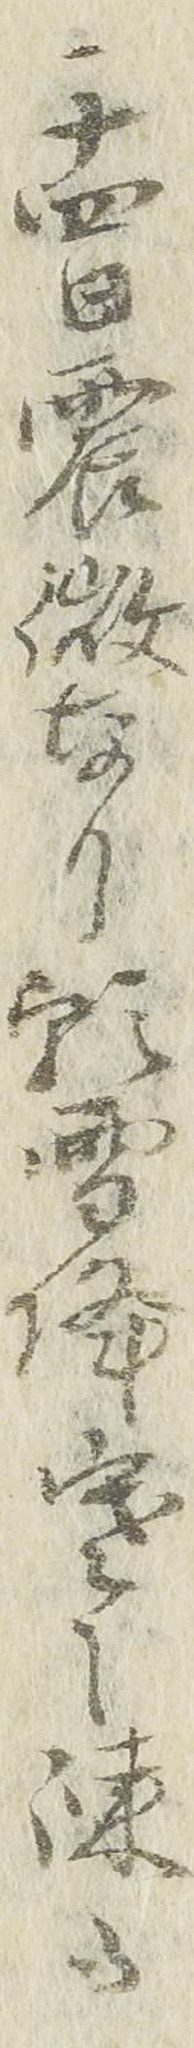・十四日震微なり朝雪降寒し凍る

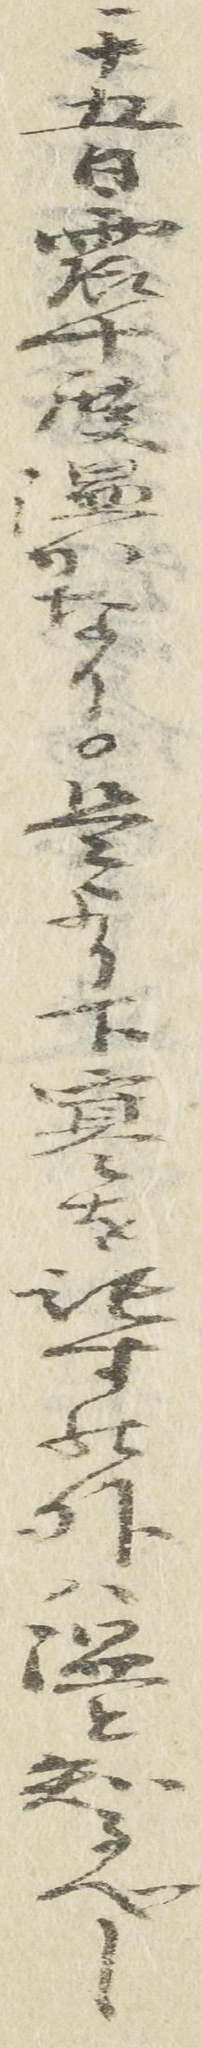、十五日震十度温かなり〇是より下寒を記すの外ハ温と知るべし
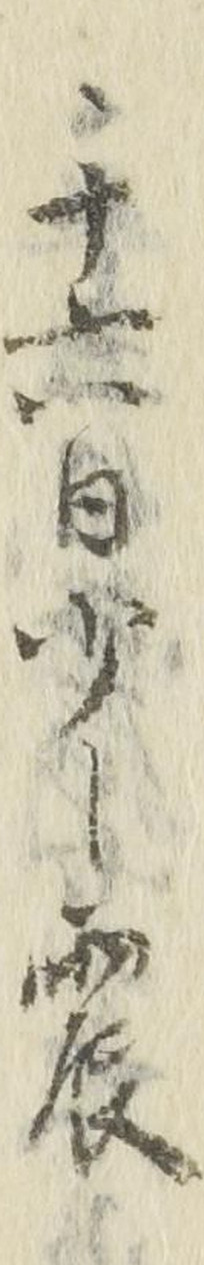、十六日少し震
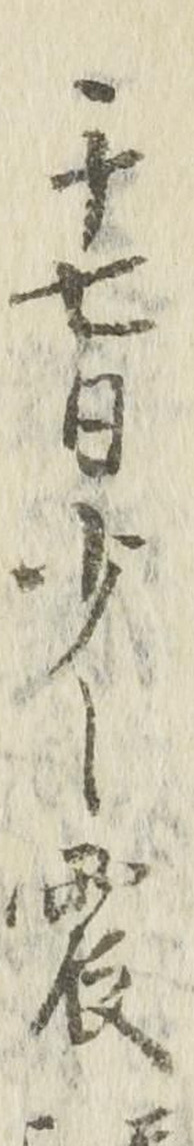、十六日少し震
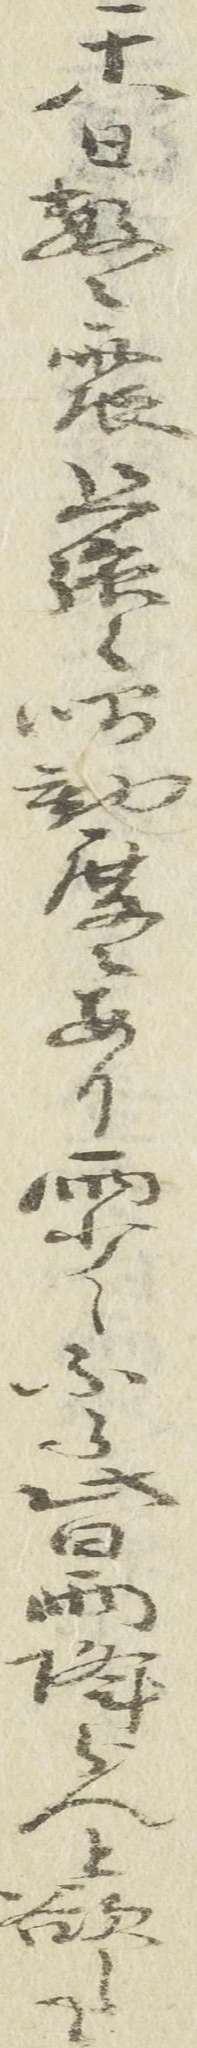、十八日数〻震且強く鳴動度〻あり雨少しふる此日雨降らんと欲して
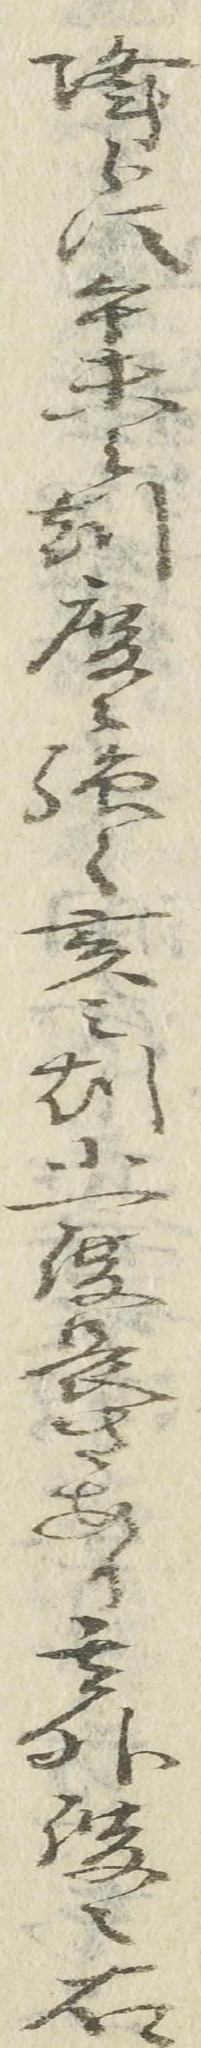降らす午未之刻度〻強く亥之刻に一度長きあり其外度〻右
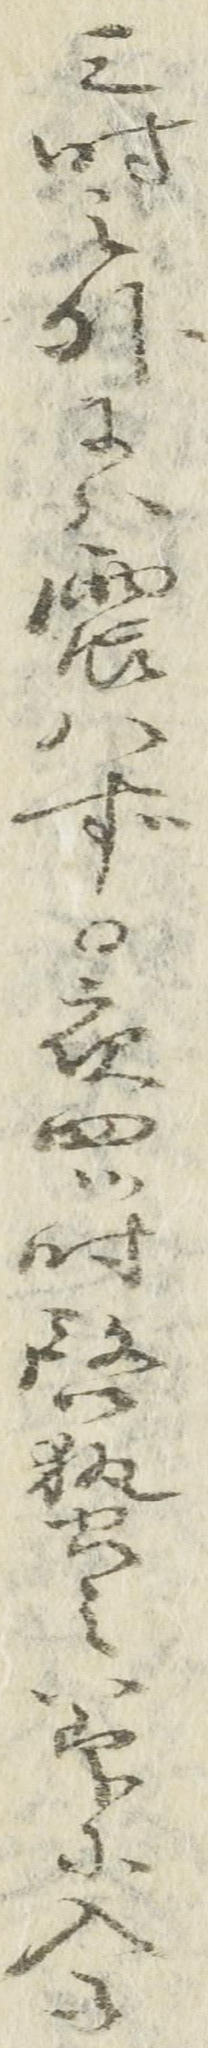三時之外にハ震ハず〇夜四ツ時啓蟄之節に入る
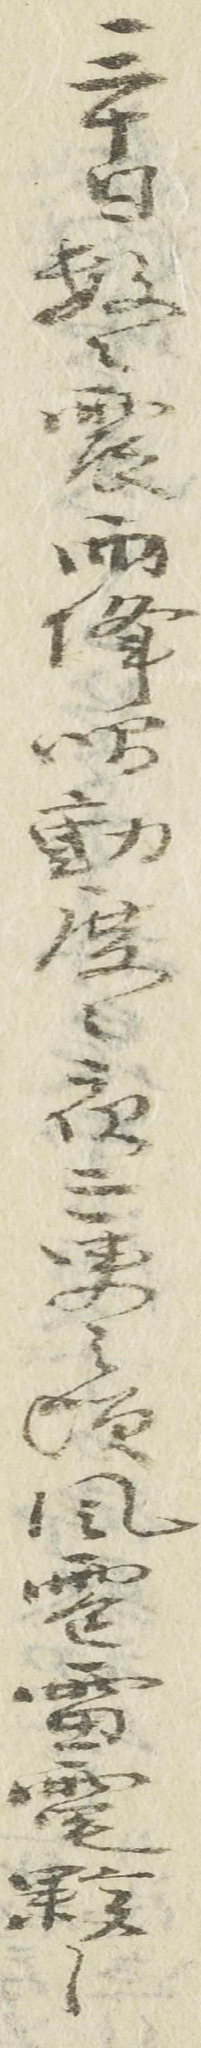、二十日数〻震雨降鳴動度〻夜二更之頃風雹雷電夥し
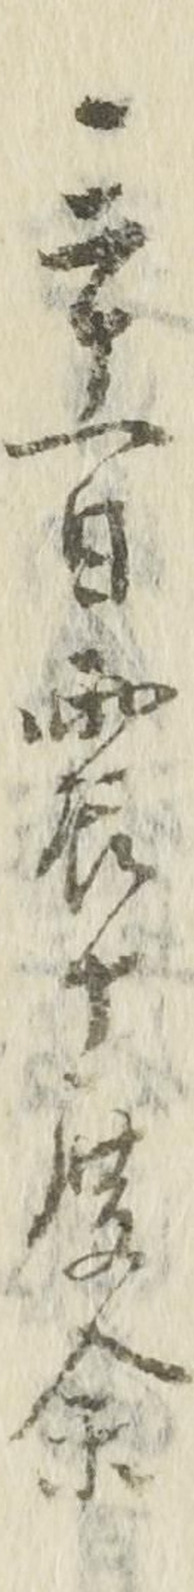、二十一日震十度余
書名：地震前兆集　全
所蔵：東京大学地震研究所図書室 Earthquake Research Institute Library, The University of Tokyo, JAPAN
